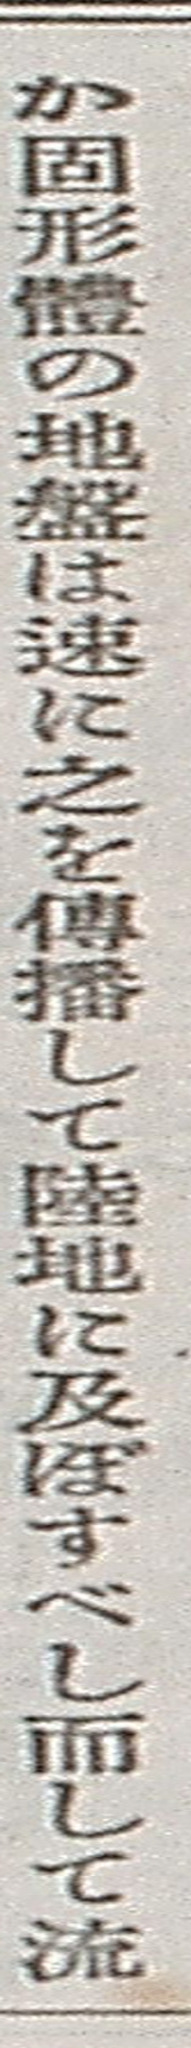か固形体の地盤は速に之を伝播して陸地に及ぼすべし而して流
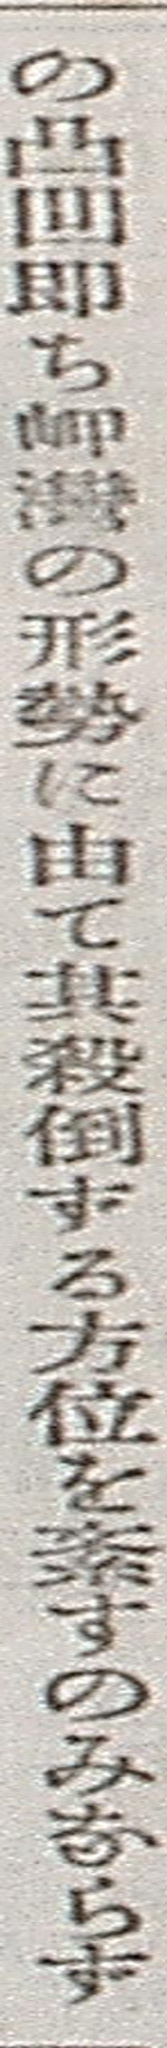の凸凹即ち岬湾の形勢に由て其殺到する方位を紊すのみならず
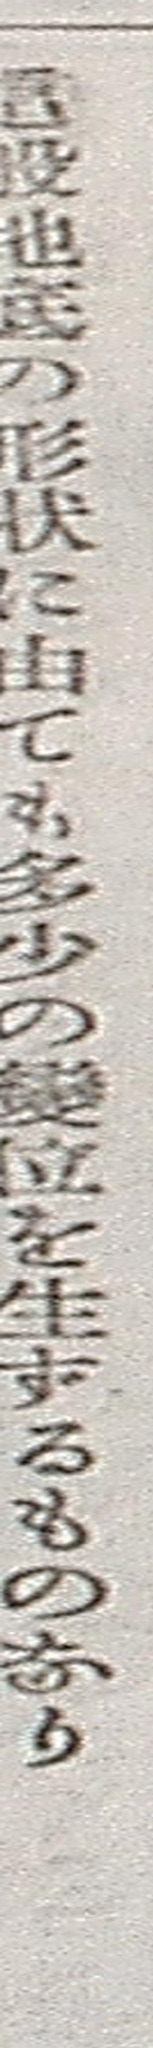這般地底の形状に由ても多少の変位を生ずるものなり
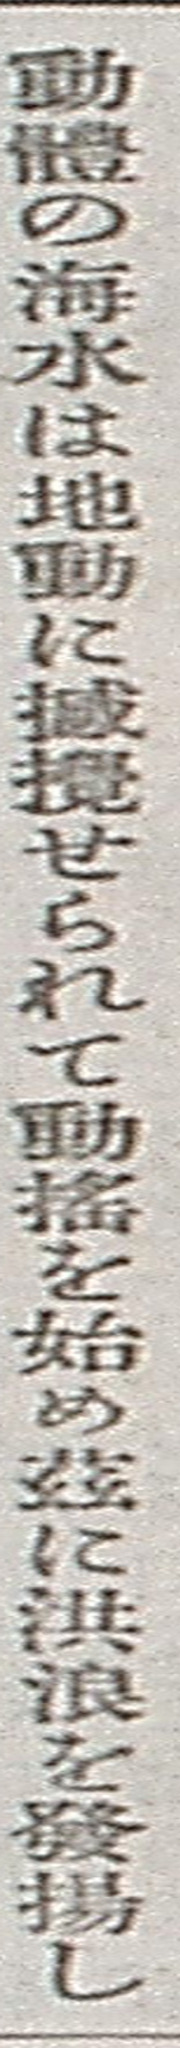動体の海水は地動に撼攪せられて動揺を始め茲に洪浪を発揚し
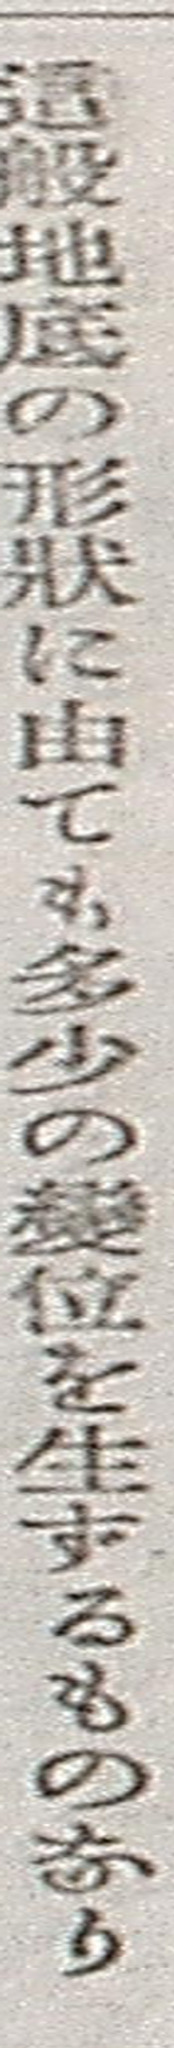這般地底の形状に由ても多少の変位を生ずるものなり
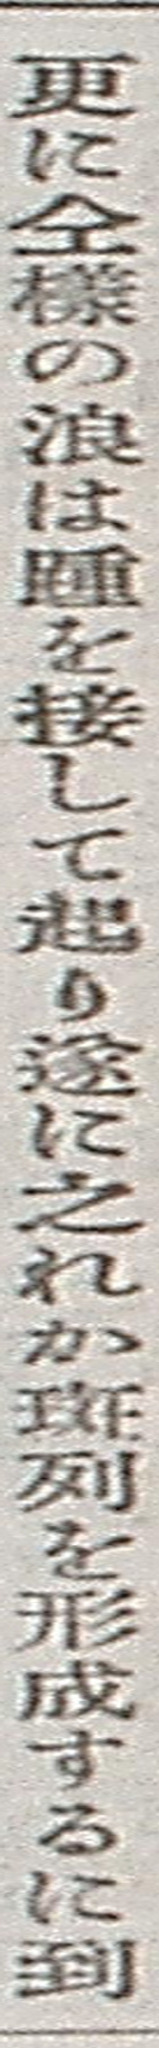更に同様の浪は踵を接して起り遂に之れか斑列を形成するに到
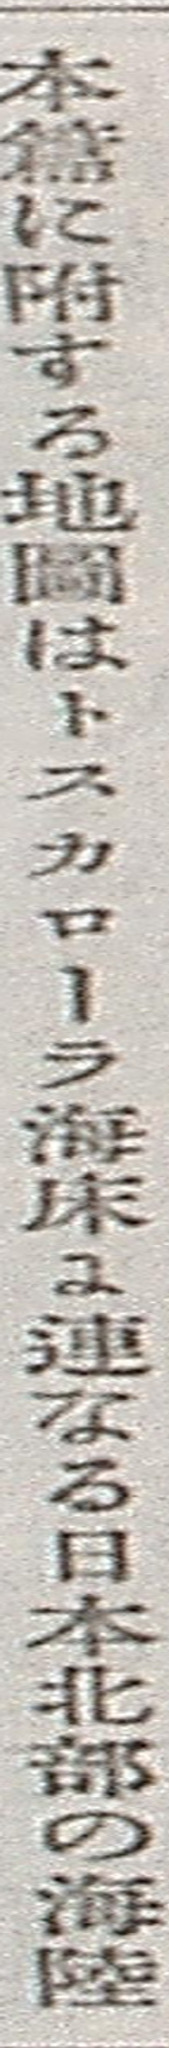本篇に付する地図はトスカローラ海床に連なる日本北部の海陸
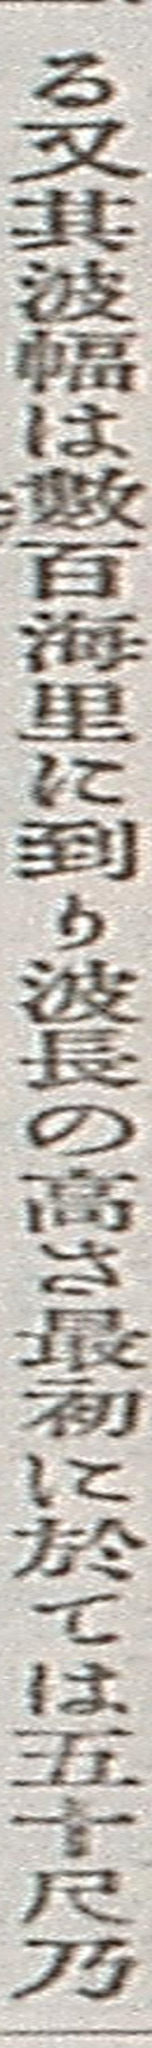る又其波幅は数百海里に到り波長の高さ最初に於ては五十尺乃
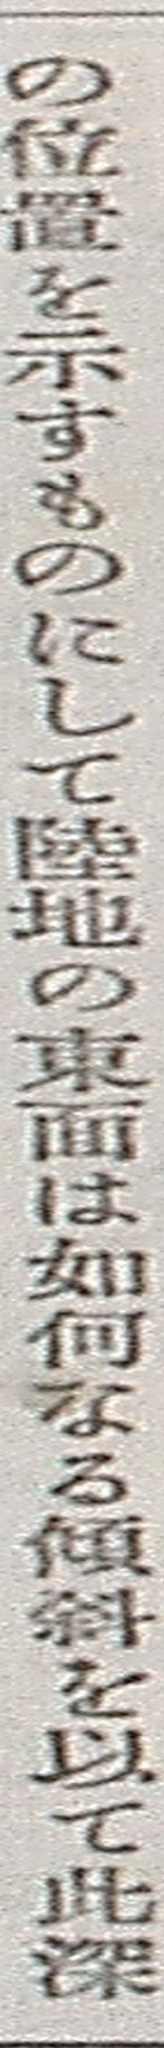の位置を示すものにして陸地の東面は如何なる傾斜を以て此深
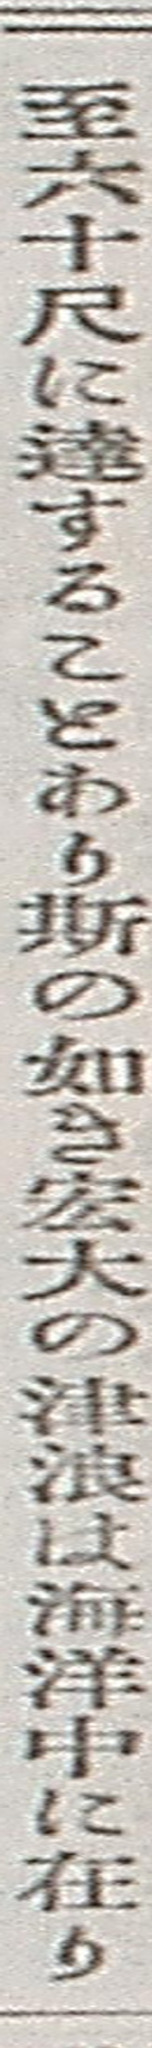至六十尺に達することあり斯の如き宏大の津浪は海洋中に在り
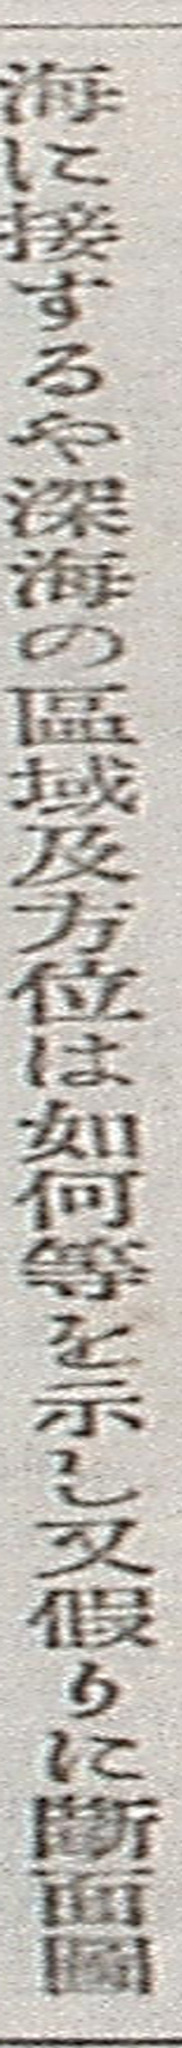海に接するや深海の区域及方位は如何等を示し又仮りに断面図
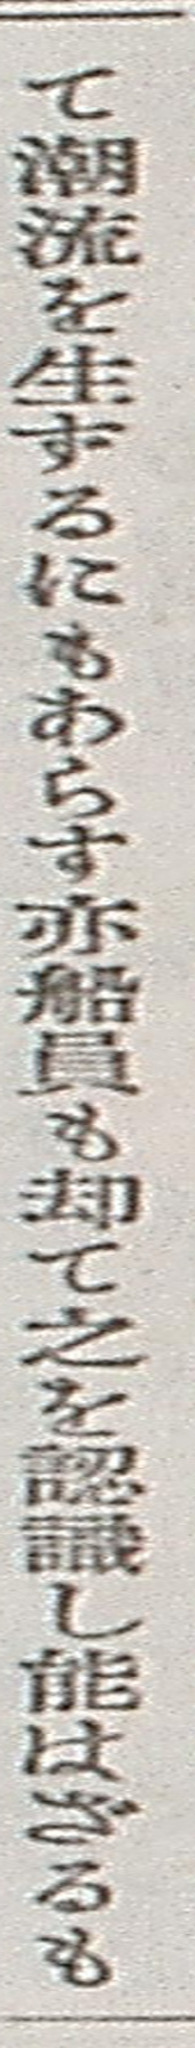て潮流を生ずるにもあらず亦船員も却て之を認識し能はざるも
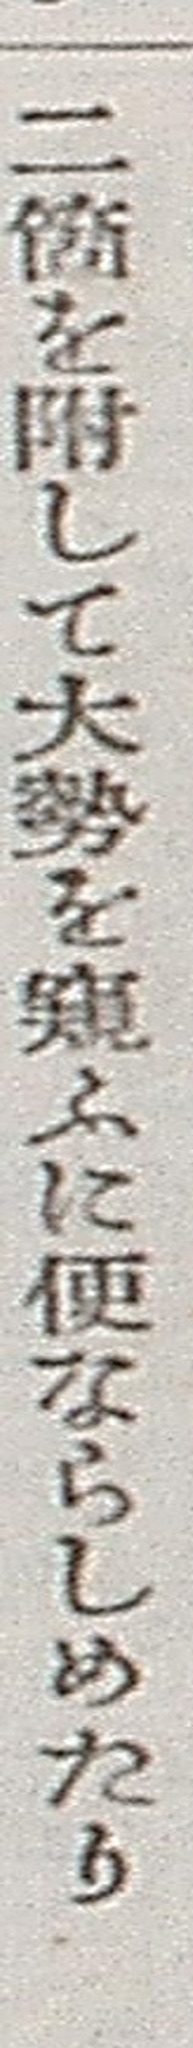二箇を付して大勢を窺ふに便ならしめたり
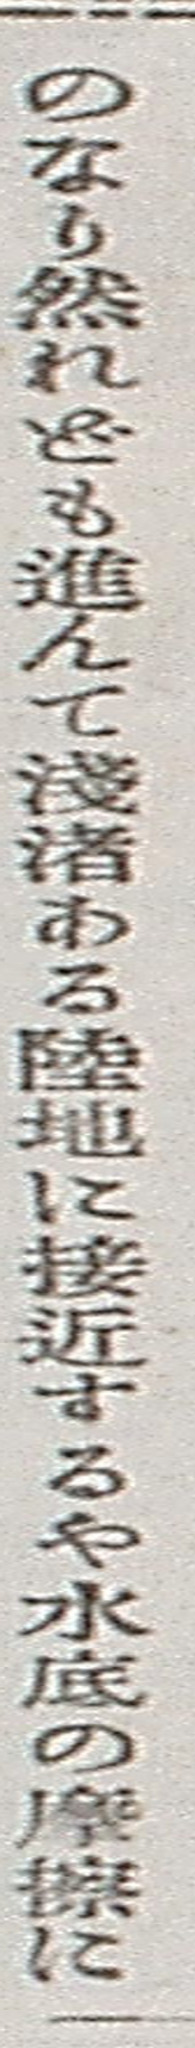のなり然れども進んて浅渚ある陸地に接近するや水底の摩擦に

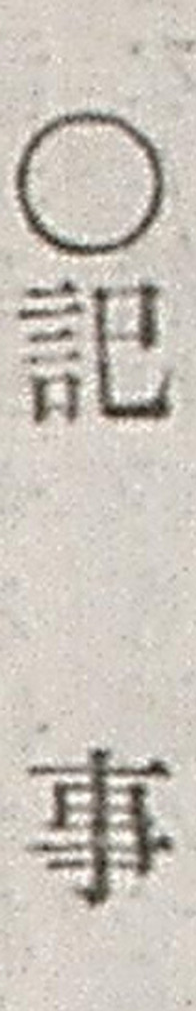○記事
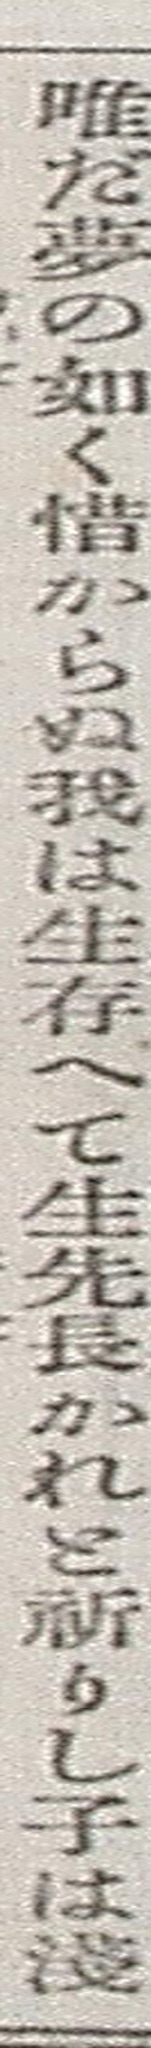唯だ夢の如く惜からぬ我は生存へて生先長かれと祈りし子は浅
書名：風俗畫報臨時増刊第百二十號　大海嘯被害録（下）
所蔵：東京大学地震研究所図書室 Earthquake Research Institute Library, The University of Tokyo, JAPAN
